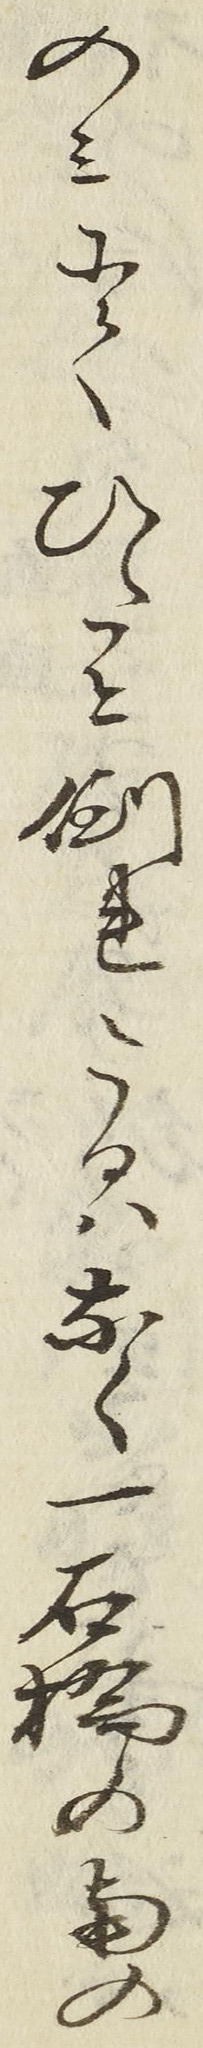のみにてひたと倒れたるはなく一石橋の南の
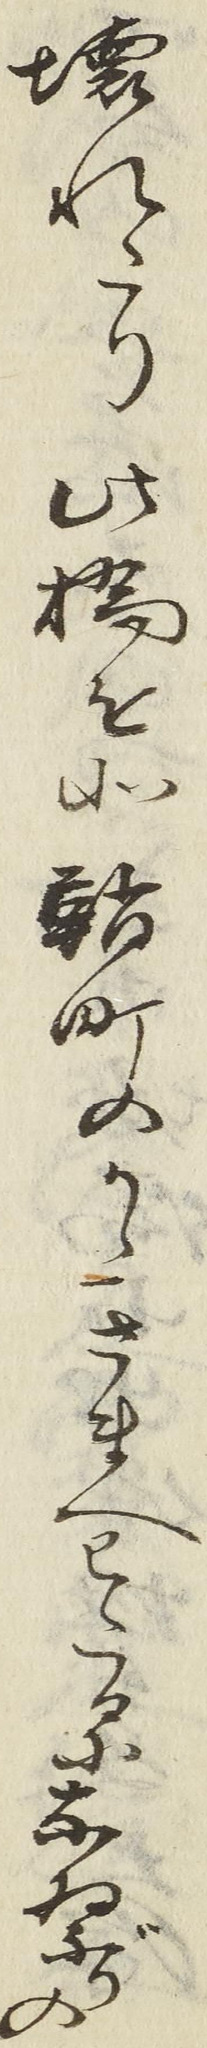壊れたり此橋を北鞘町のかたさまへわたるになゐぶりの
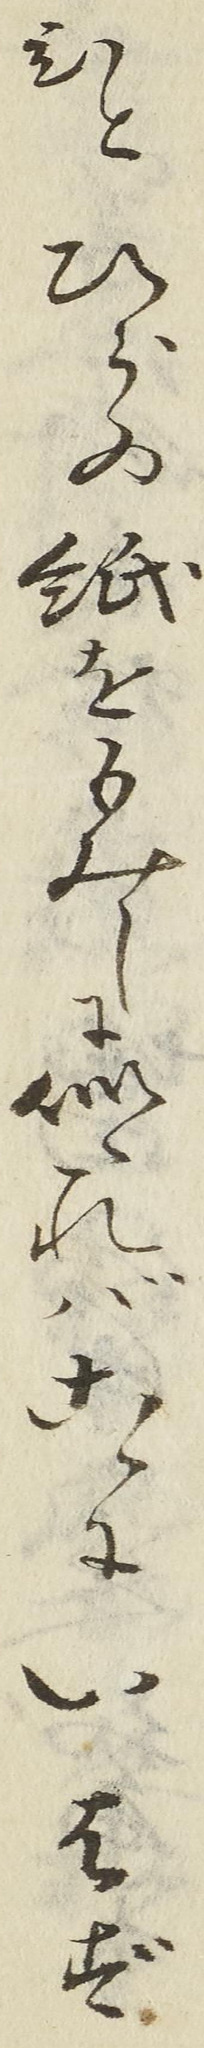ひとひらの紙をもみしに似たればこゝにいはず
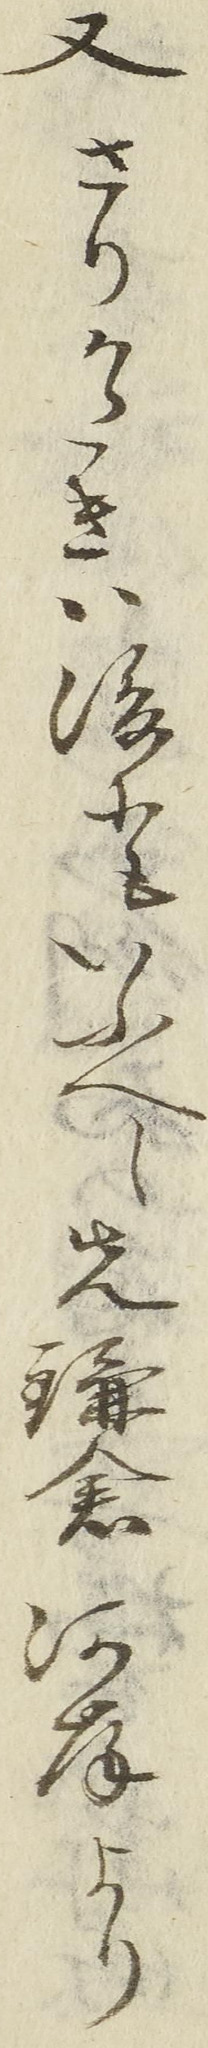又さりかたきは後にもいふへし先鎌倉河岸より
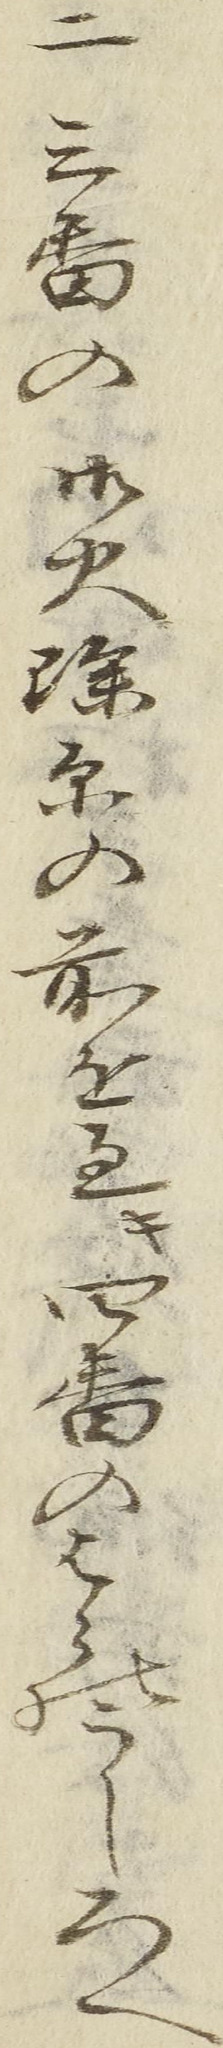ニ三番の御火除原の前を過き四番のはらのうしろへ

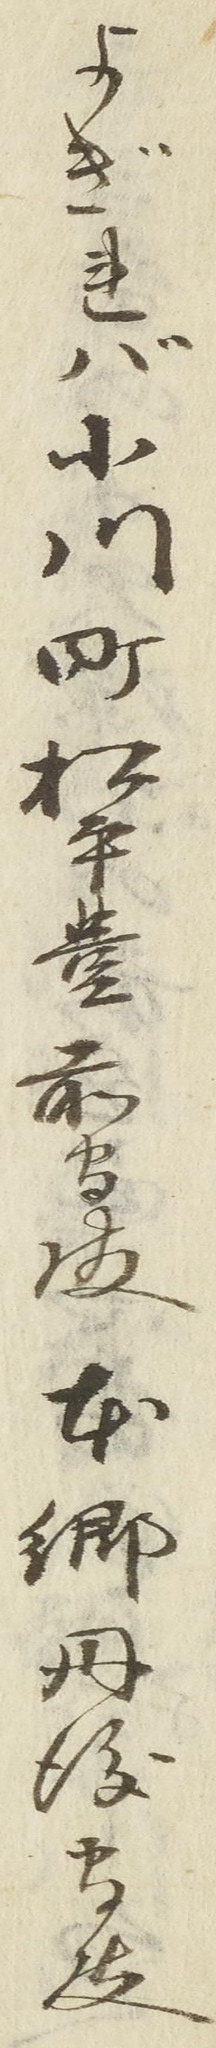よぎれば小川町松平豊前守殿本郷丹後守殿
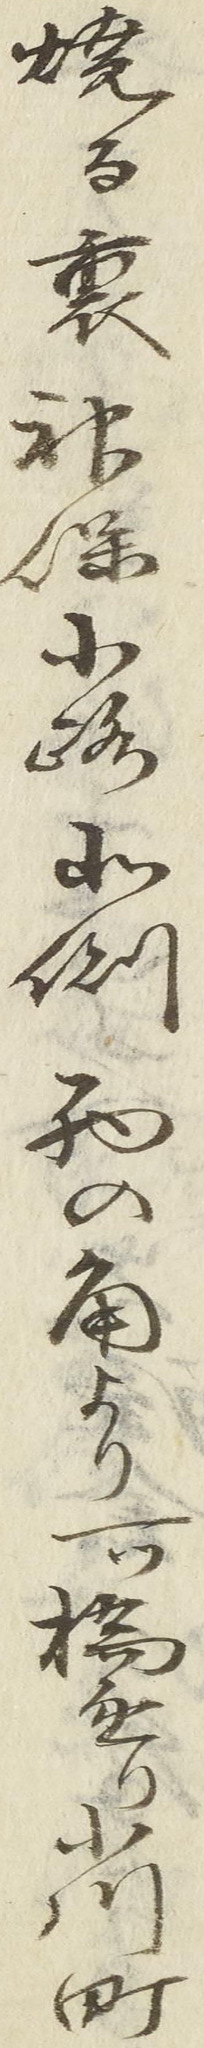焼る裏神保小路北側西の角より一ツ橋通り小川町
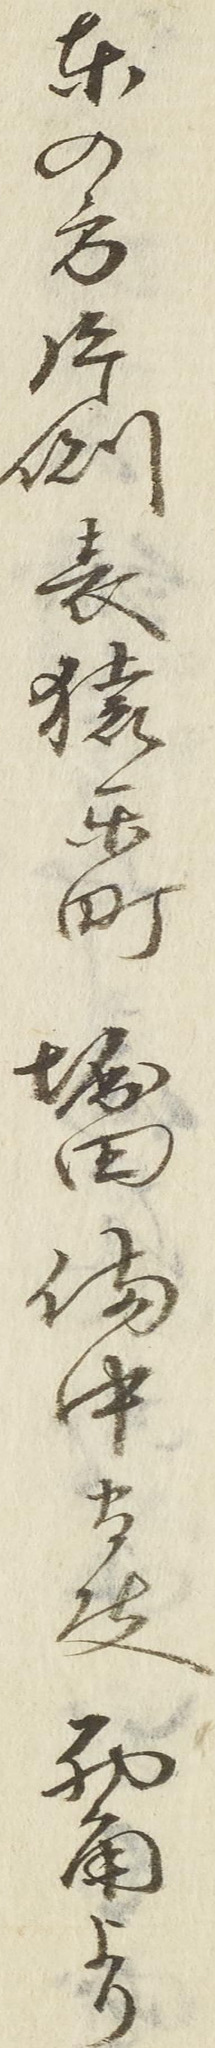東の方片側表猿楽町堀田備中守殿西角より
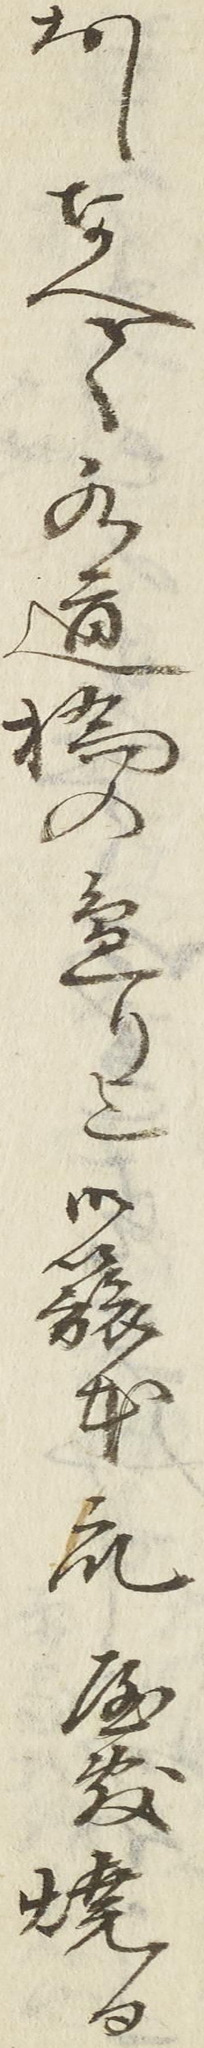おしなへて水道橋の辺り迄御籏本衆屋敷焼る
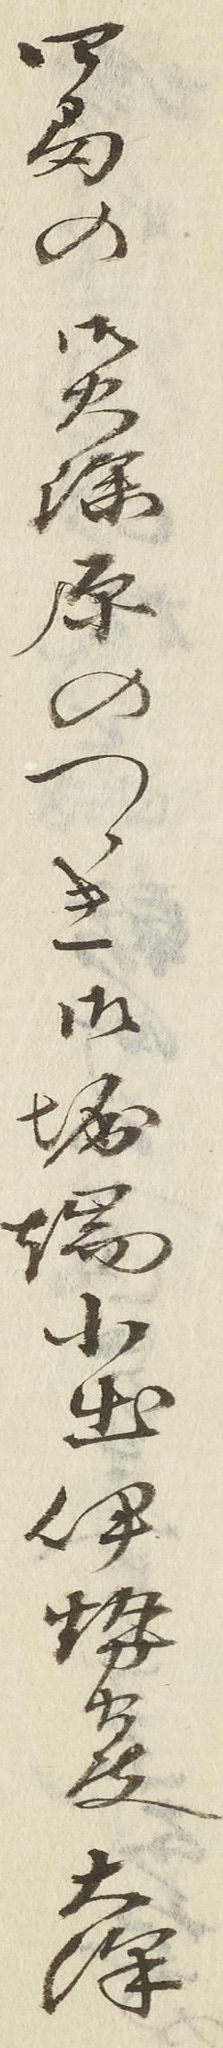四番の御火除原のつゝき御堀端小出伊勢守殿大沢
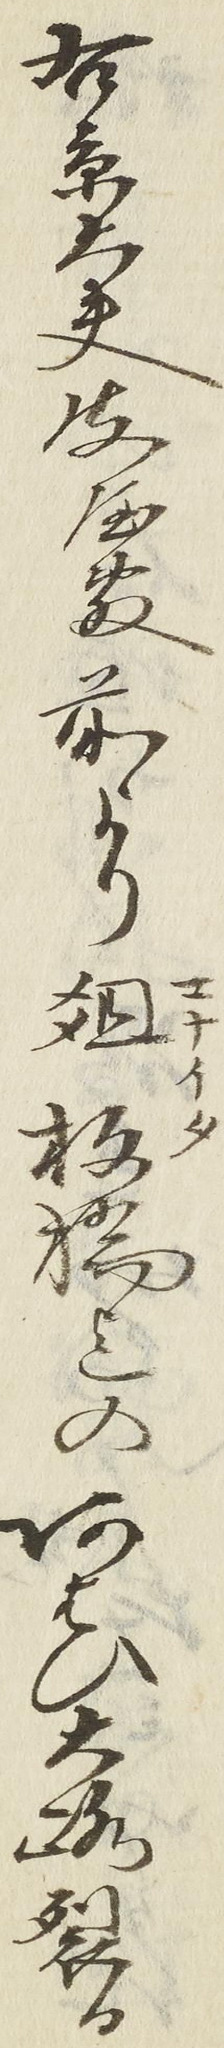右京大夫殿屋敷前より俎板橋迄のあはひ大路裂る
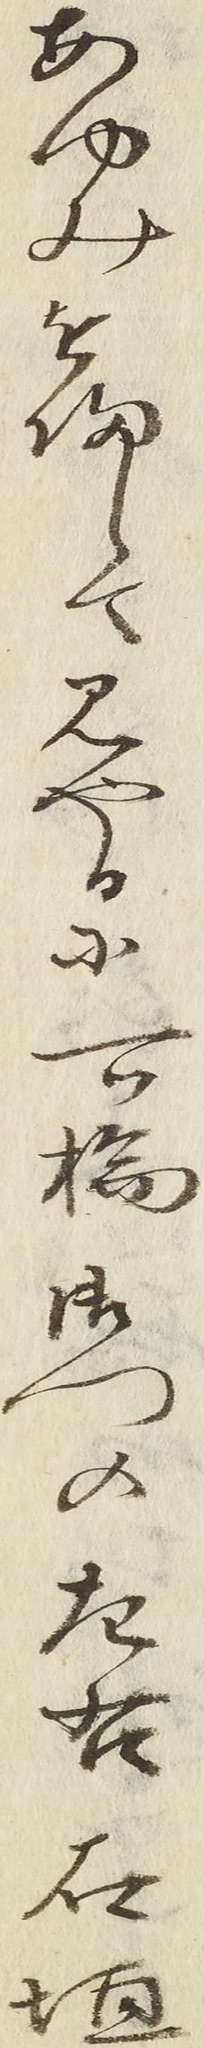あゆみを帰して見やるに一ツ橋御門の左右石垣
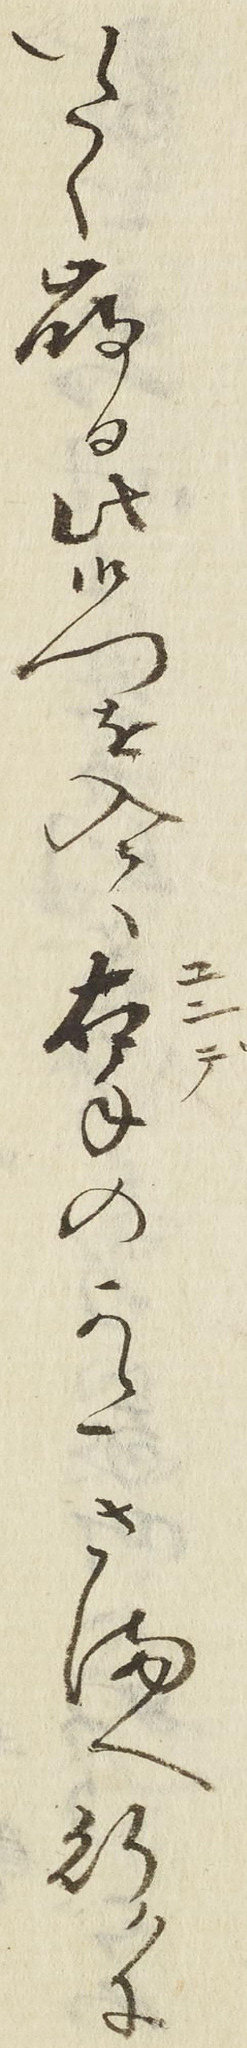いたく崩る此御門を入て右手のかたさまへ行くに
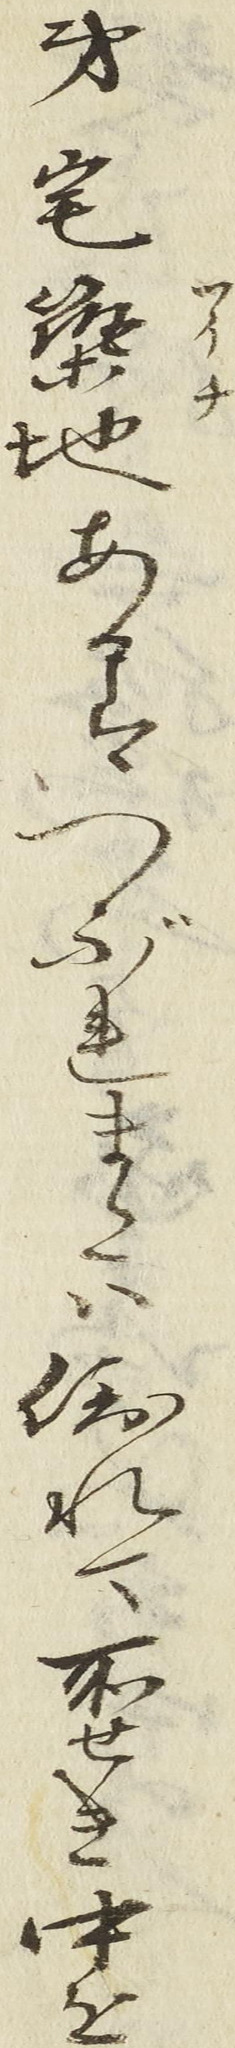第宅築地あるはつぶれまたは倒れて所せき中を
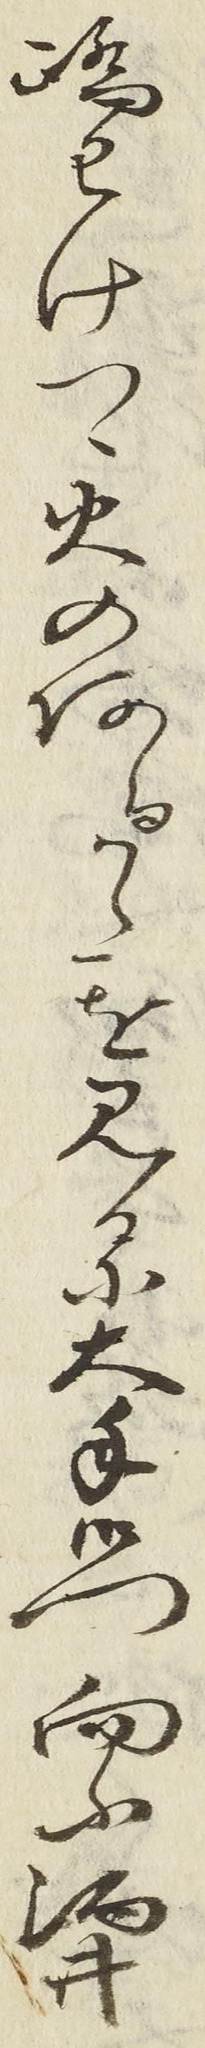踏わけつゝ火のあるかたを見るに大手御門向ふ酒井
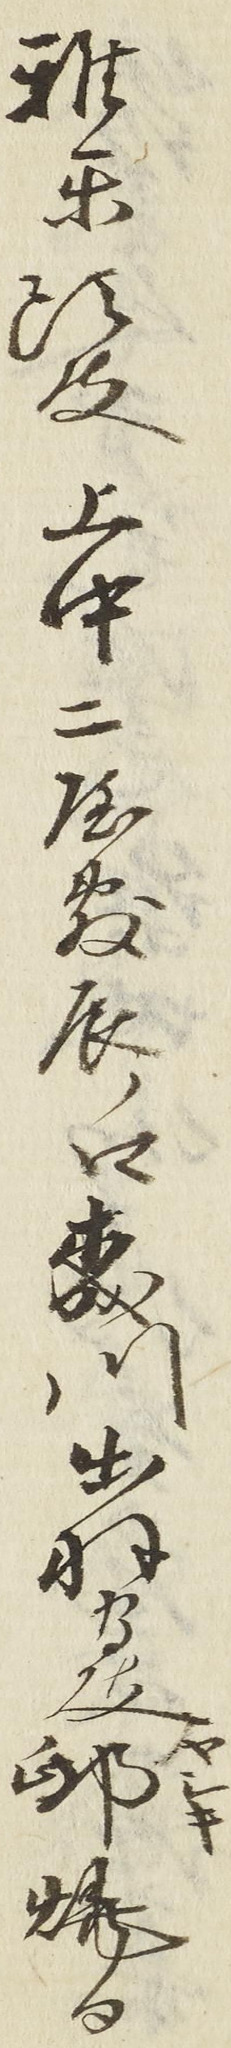雅楽頭殿上中二屋敷辰ノ口森川出羽守殿邸焼る
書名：やぶれ窓の記　全
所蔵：東京大学地震研究所図書室 Earthquake Research Institute Library, The University of Tokyo, JAPAN
